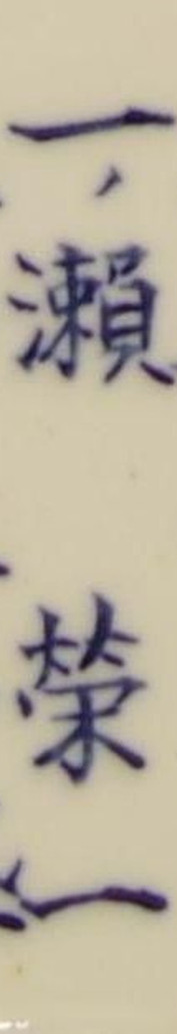一ノ瀬榮一
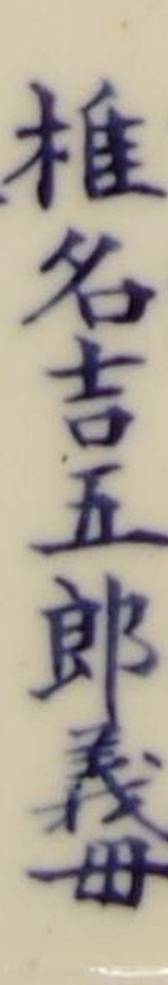椎名吉五郎義母
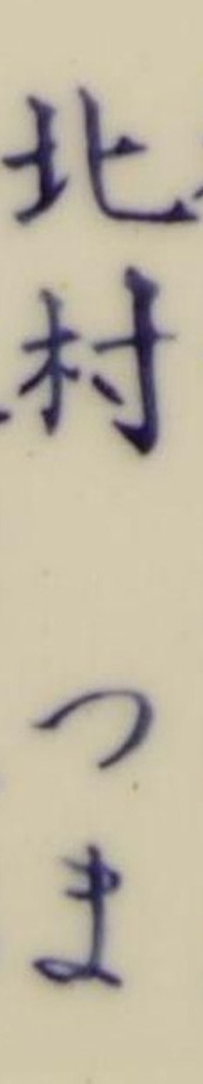北村つま
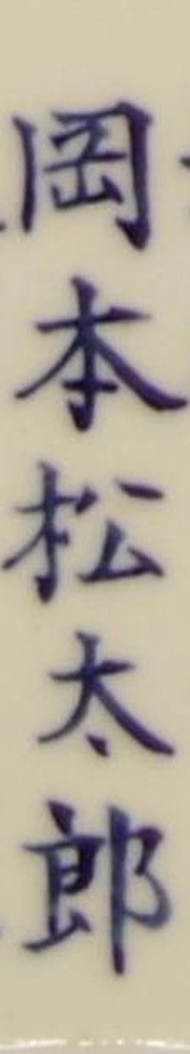岡本松太郎
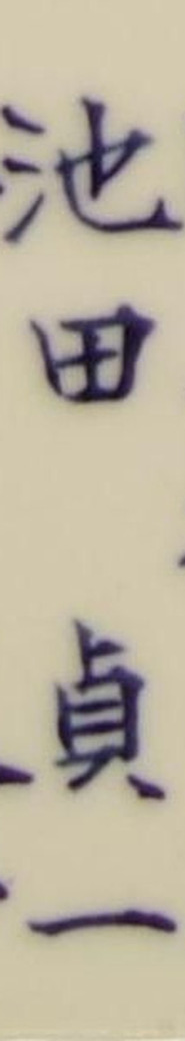池田貞一

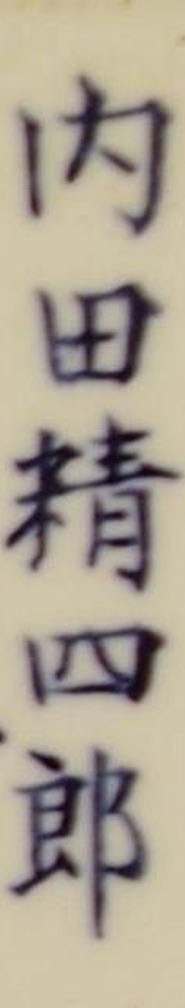内田精四郎
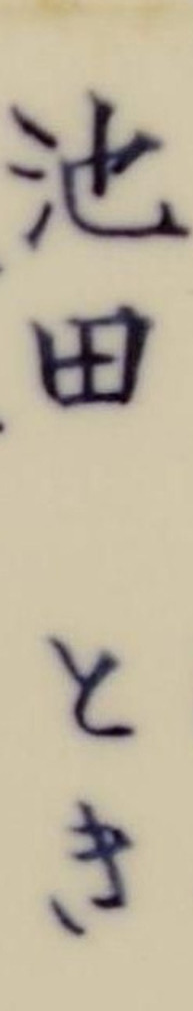池田とき
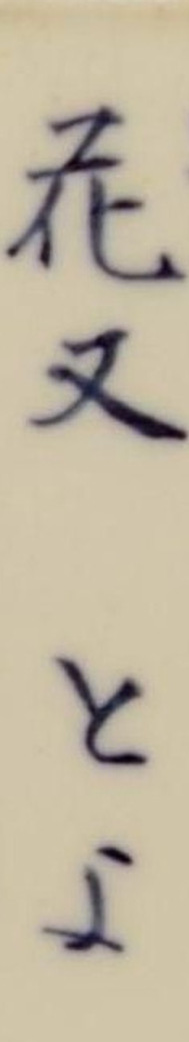花又とよ
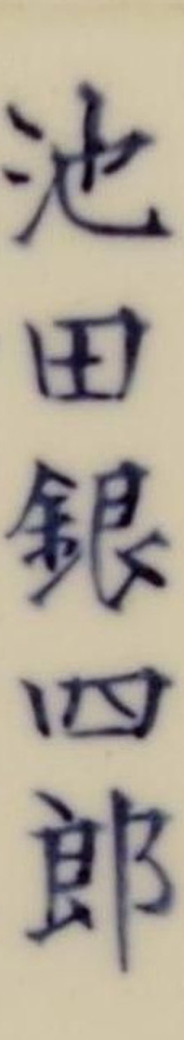池田銀四郎
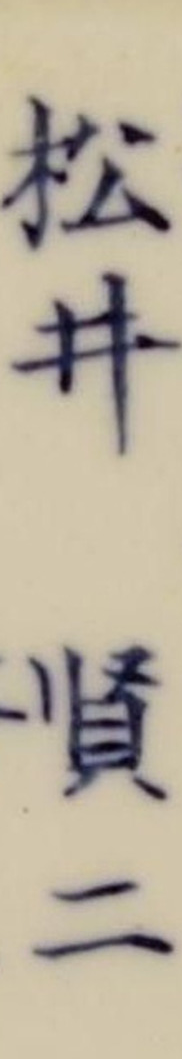松井賢二
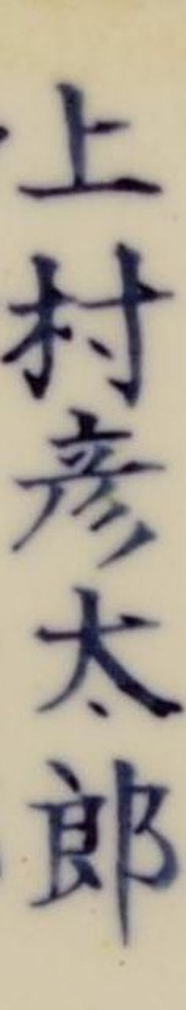上村彦太郎
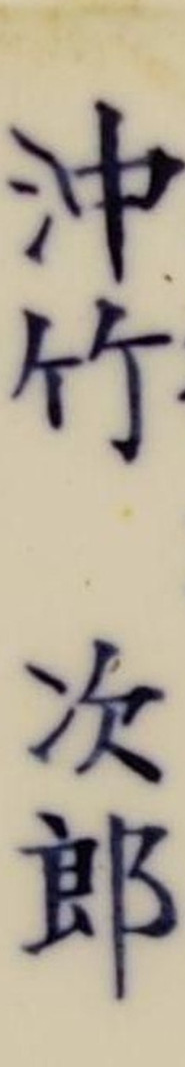沖竹次郎
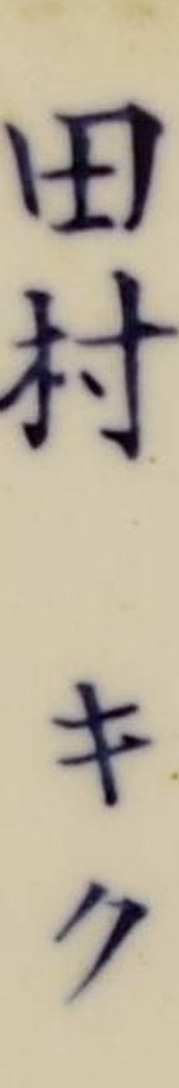田村キク
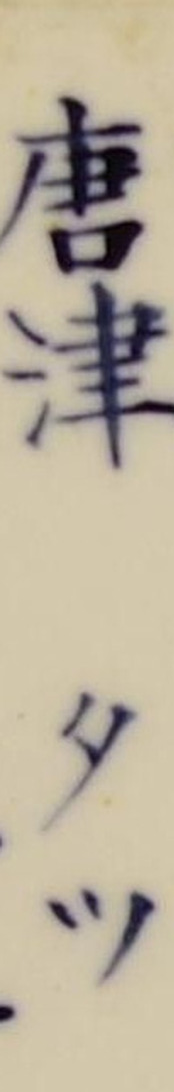唐津タツ
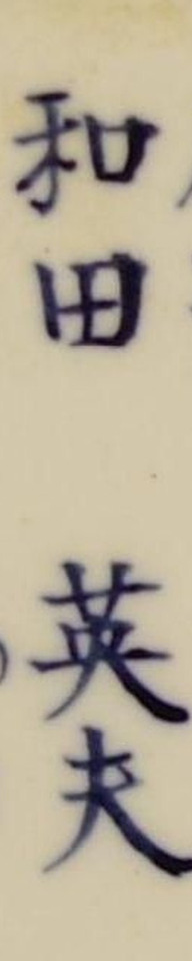和田英夫
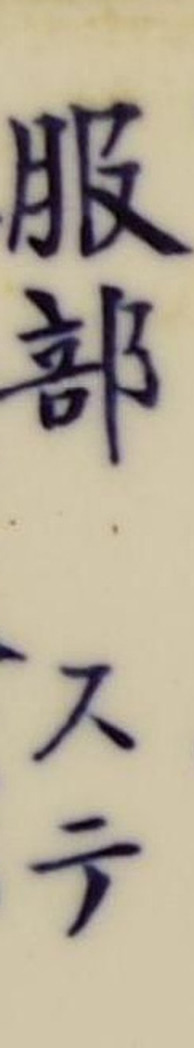服部ステ
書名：E~L
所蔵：高野山金剛峯寺
